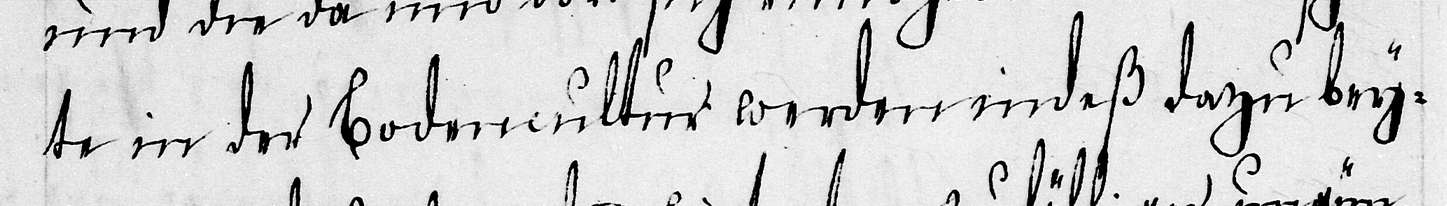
te in der Bodencultur werden indeß dazu bey¬
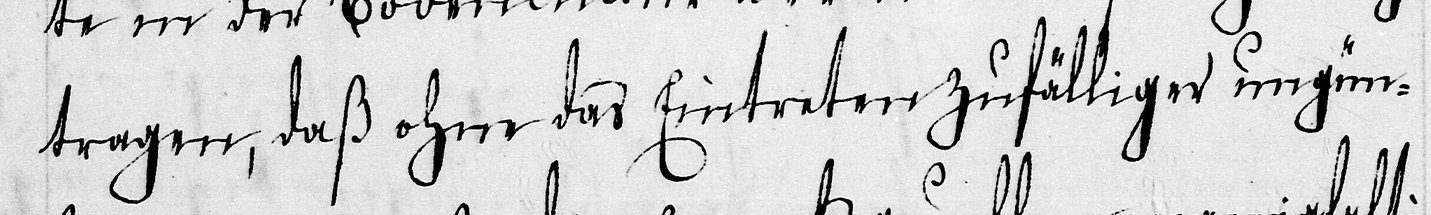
tragen, daß ohne das Eintreten zufälliger ungün¬
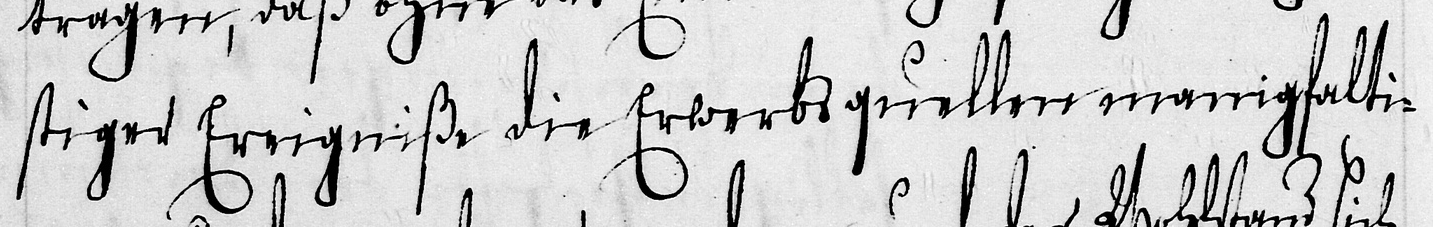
stiger Ereigniße die Erwerbsquellen manigfalti¬
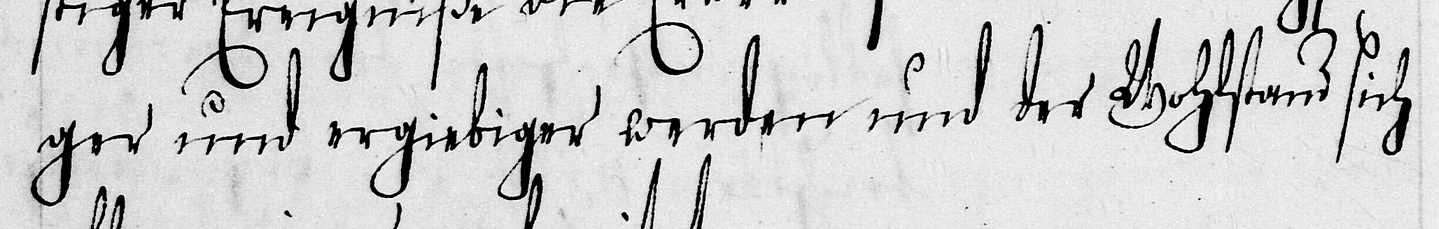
ger und ergiebiger werden und der Wohlstand sich
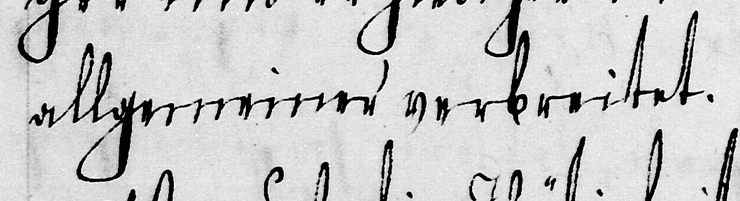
allgemeiner verbreitet.
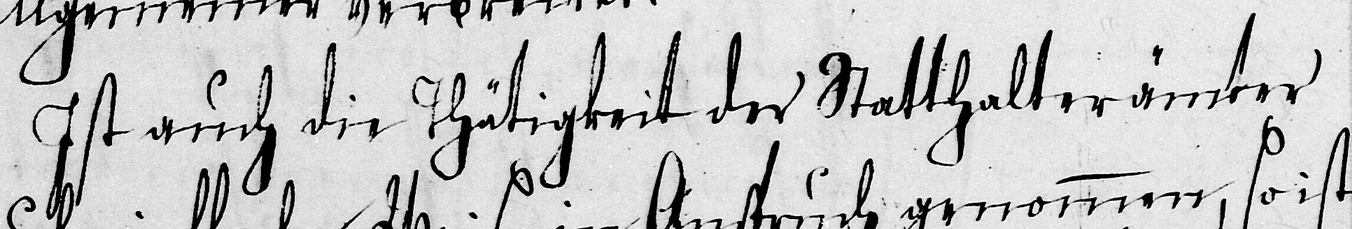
Ist auch die Thätigkeit der Statthalterämter
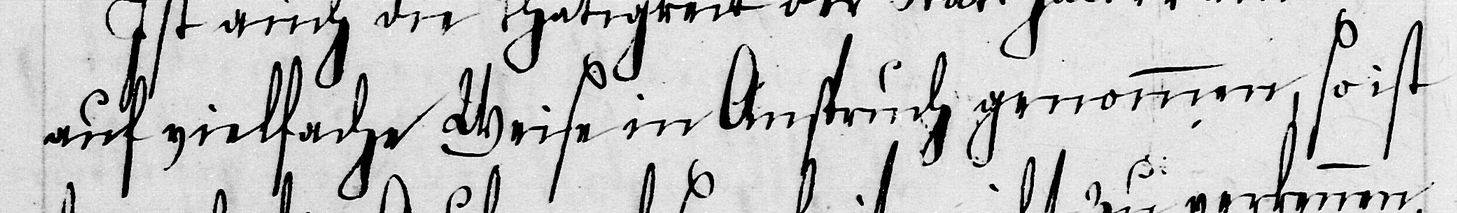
auf vielfache Weise in Anspruch genommen, so ist
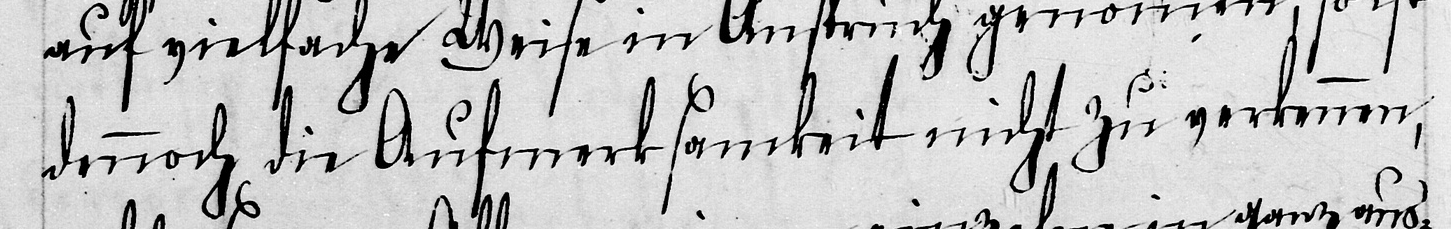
dennoch die Aufmerksamkeit nicht zu verkennen,
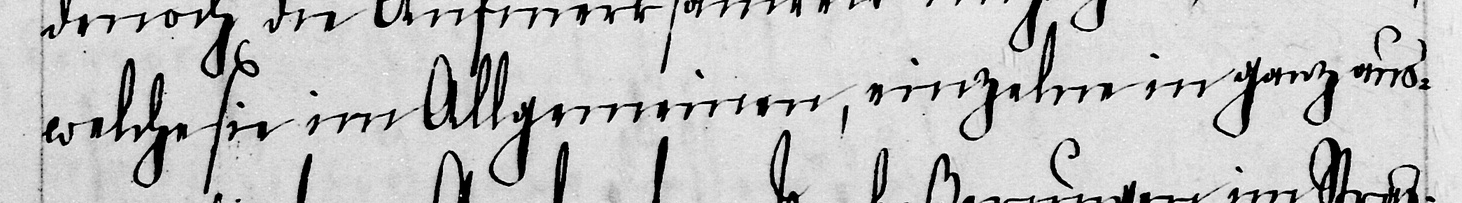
welche sie im Allgemeinen, einzelne in ganz aus¬
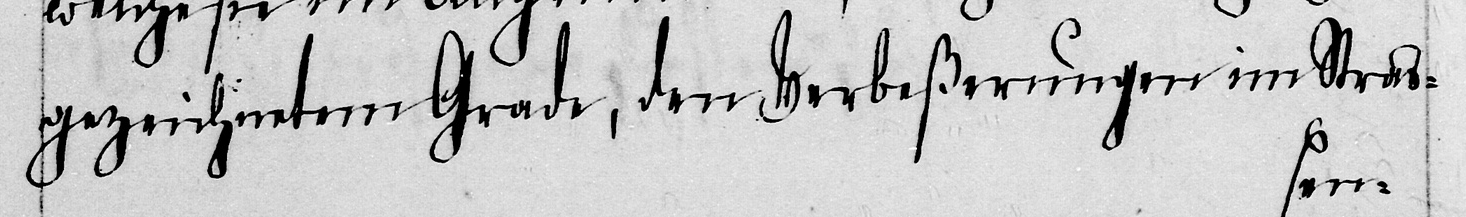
gezeichnetem Grade, den Verbeßerungen im Stras-
